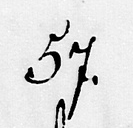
ch¬
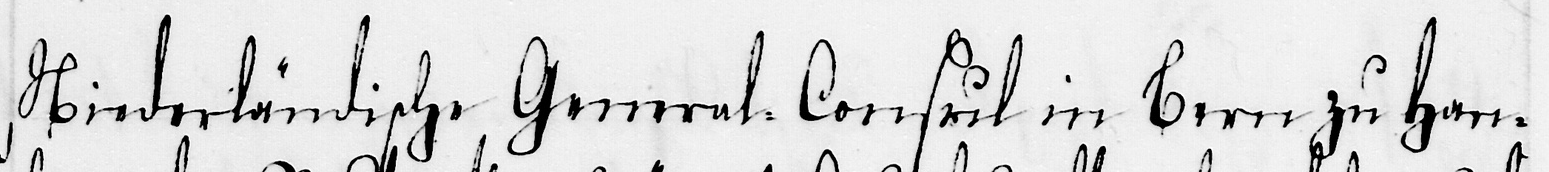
Niederländische General-Consul in Bern zu Han¬
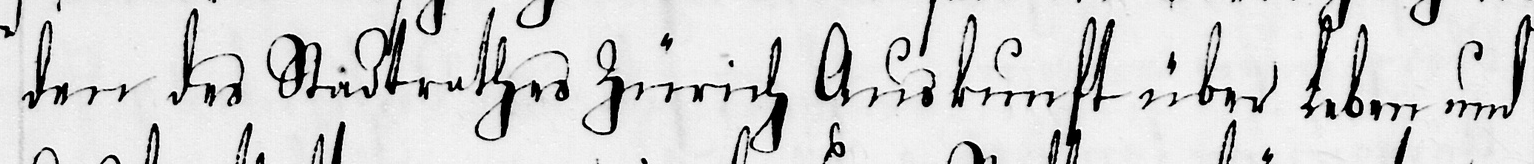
den des Stadtrathes Zürich Auskunft über Leben und
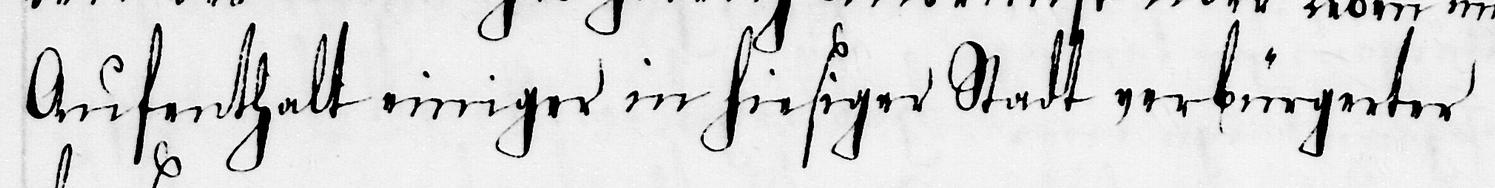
Aufenthalt einiger in hiesiger Stadt verbürgerter
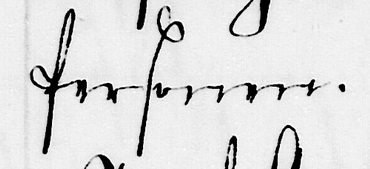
Personen.
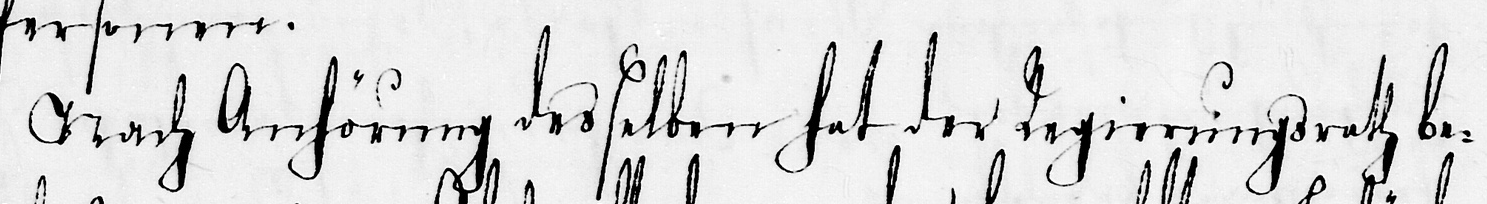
Nach Anhörung desselben hat der Regierungsrath be¬
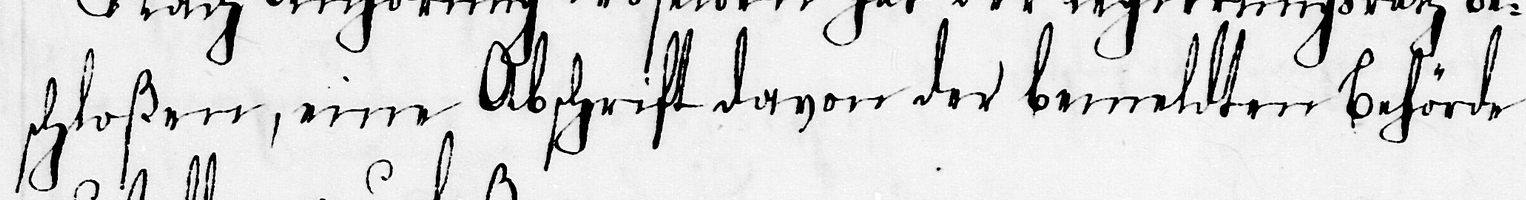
schloßen, eine Abschrift davon der bemeldten Behörde
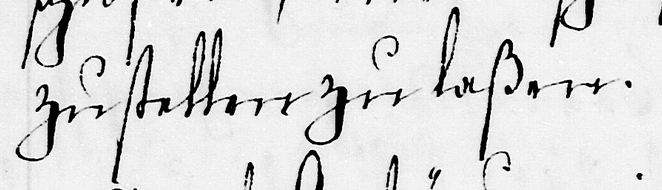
zustellen zu laßen.
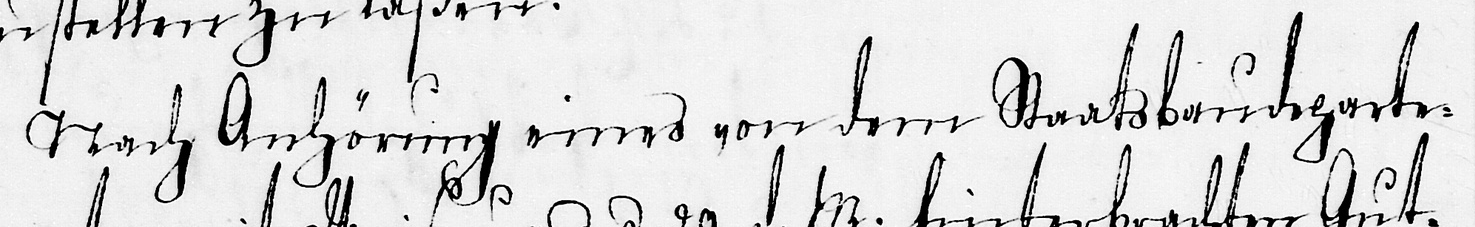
Nach Anhörung eines von dem Staatsbaudeparte¬
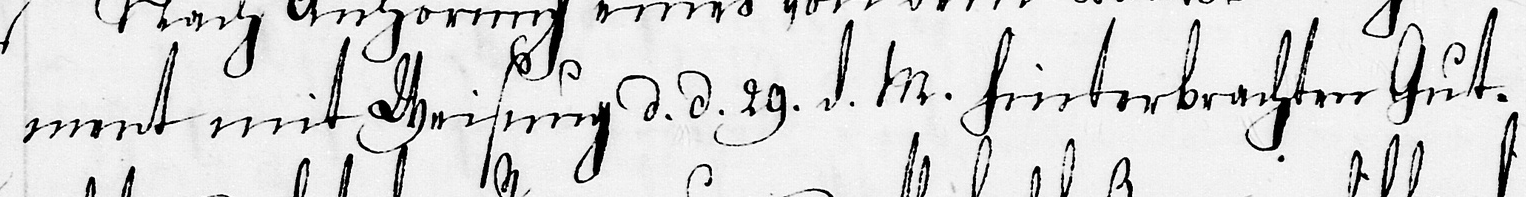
ment mit Weisung d. d. 29. d. M. hinterbrachten Gut¬
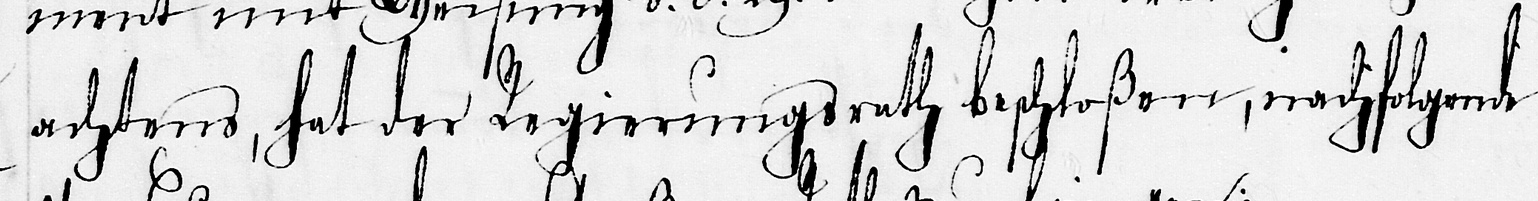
achtens, hat der Regierungsrath beschloßen, nachfolgen¬
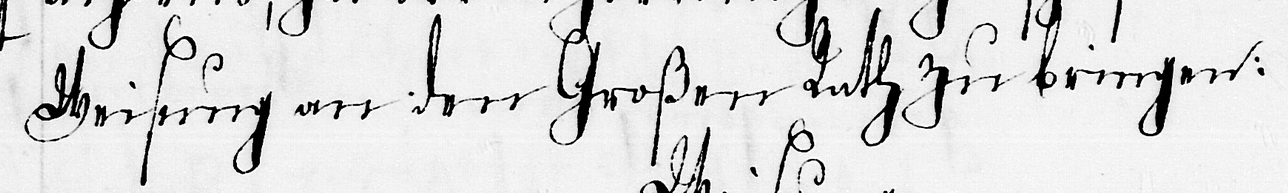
Weisung an den Großen Rath zu bringen:
